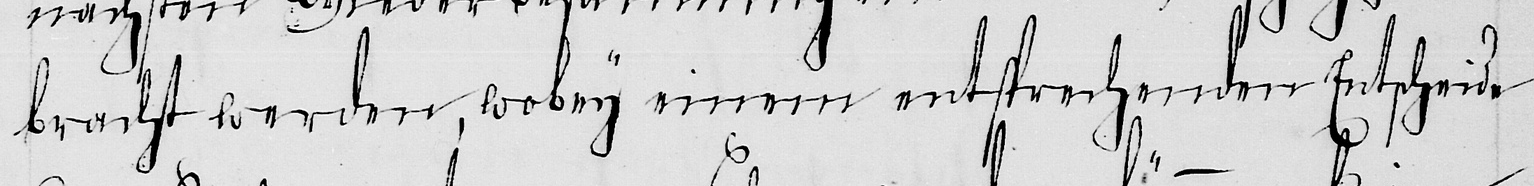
bracht werden, wobey einem entsprechenden Entscheide
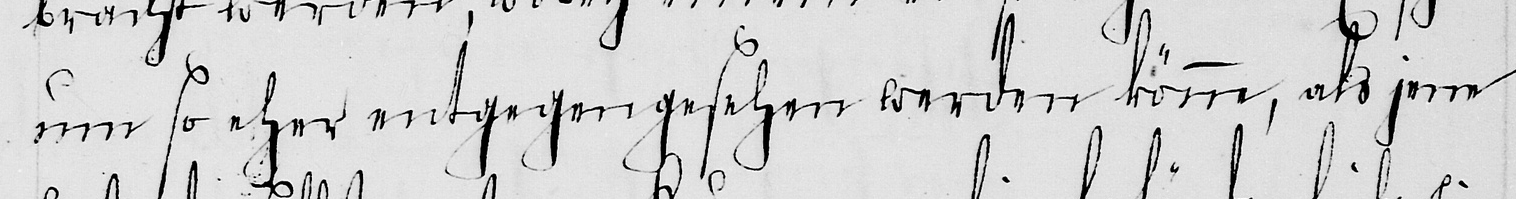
um so eher entgegengesehen werden könne, als jene
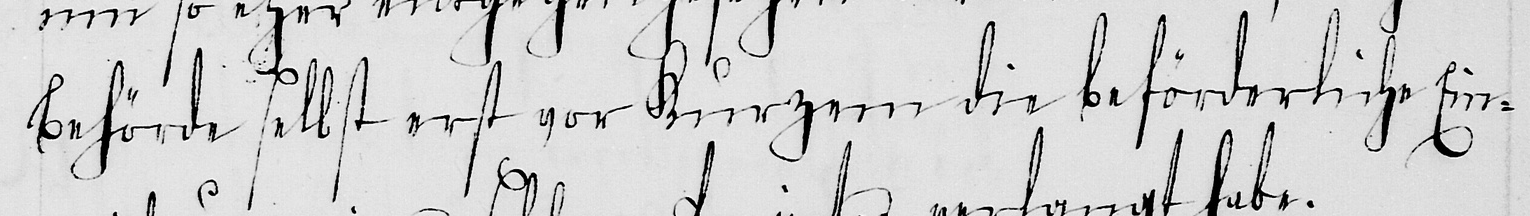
Behörde selbst erst vor Kurzem die beförderliche Ein¬
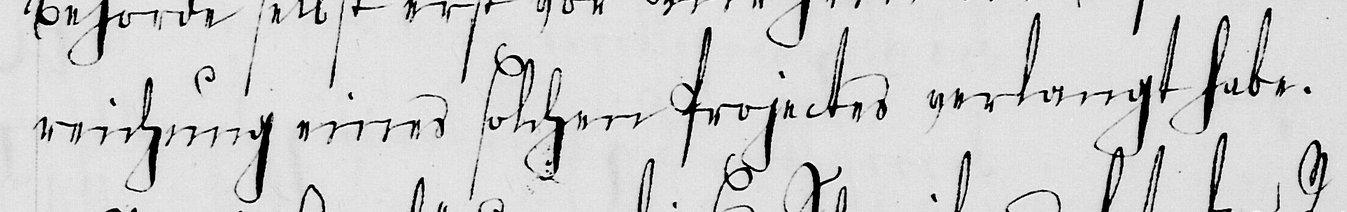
reichung eines solchen Projectes verlangt habe.
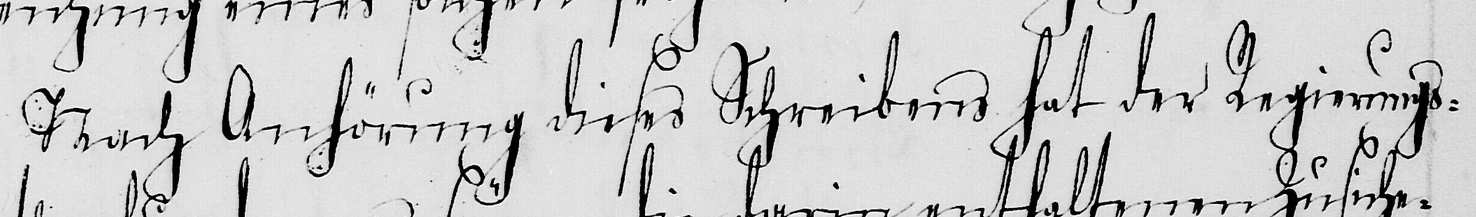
Nach Anhörung dieses Schreibens hat der Regierungs¬
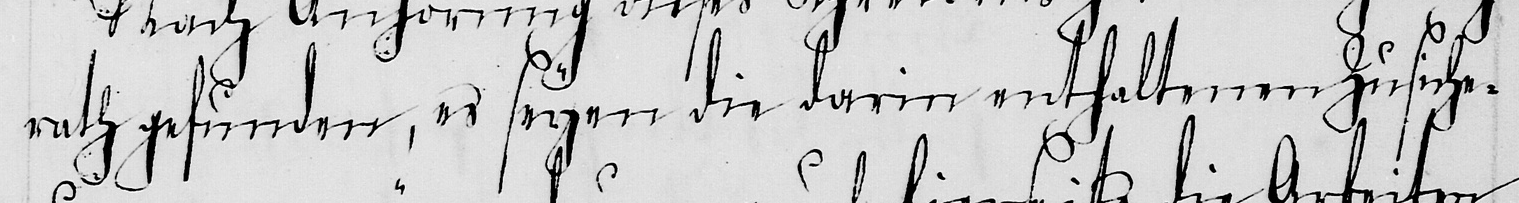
rath gefunden, es seyen die darin enthaltenen Zusiche¬
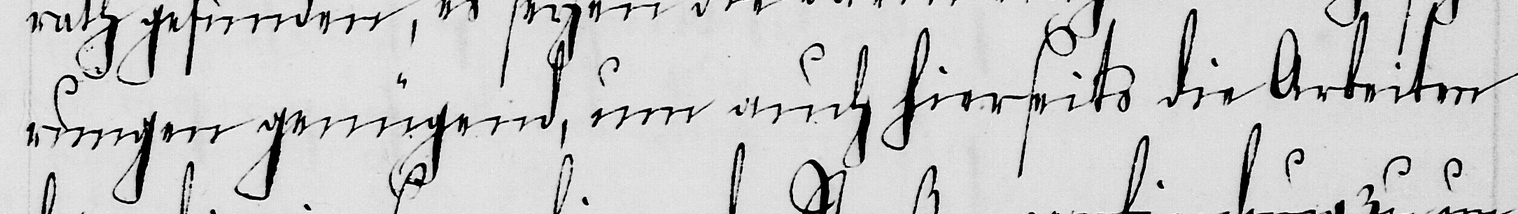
rungen genügend, um auch hierseits die Arbeiten
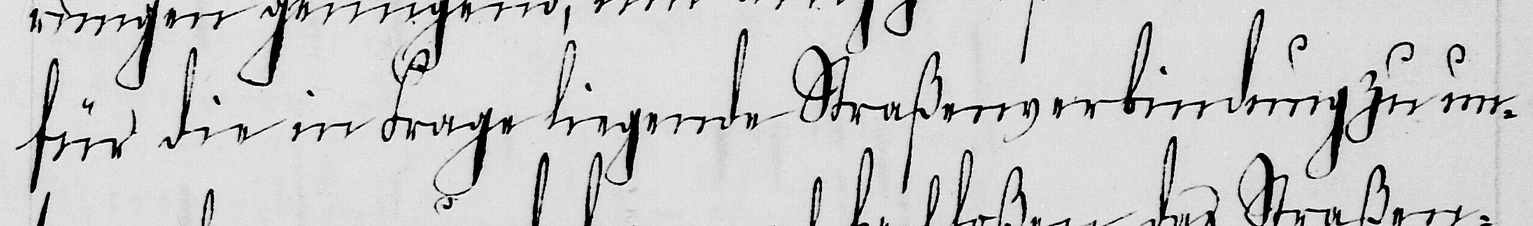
für die in Frage liegende Straßenverbindung zu un¬
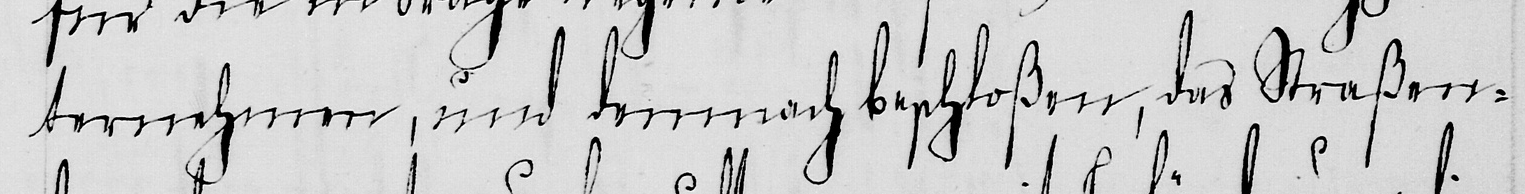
ternehmen, und demnach beschloßen, das Straßen¬
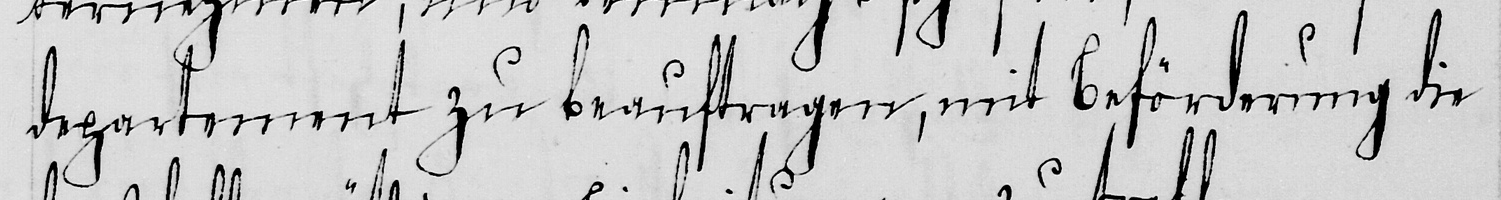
departement zu beauftragen, mit Beförderung die
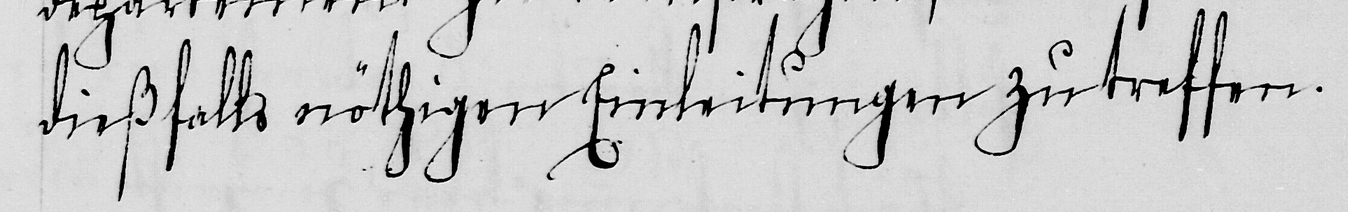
dießfalls nöthigen Einleitungen zu treffen.
